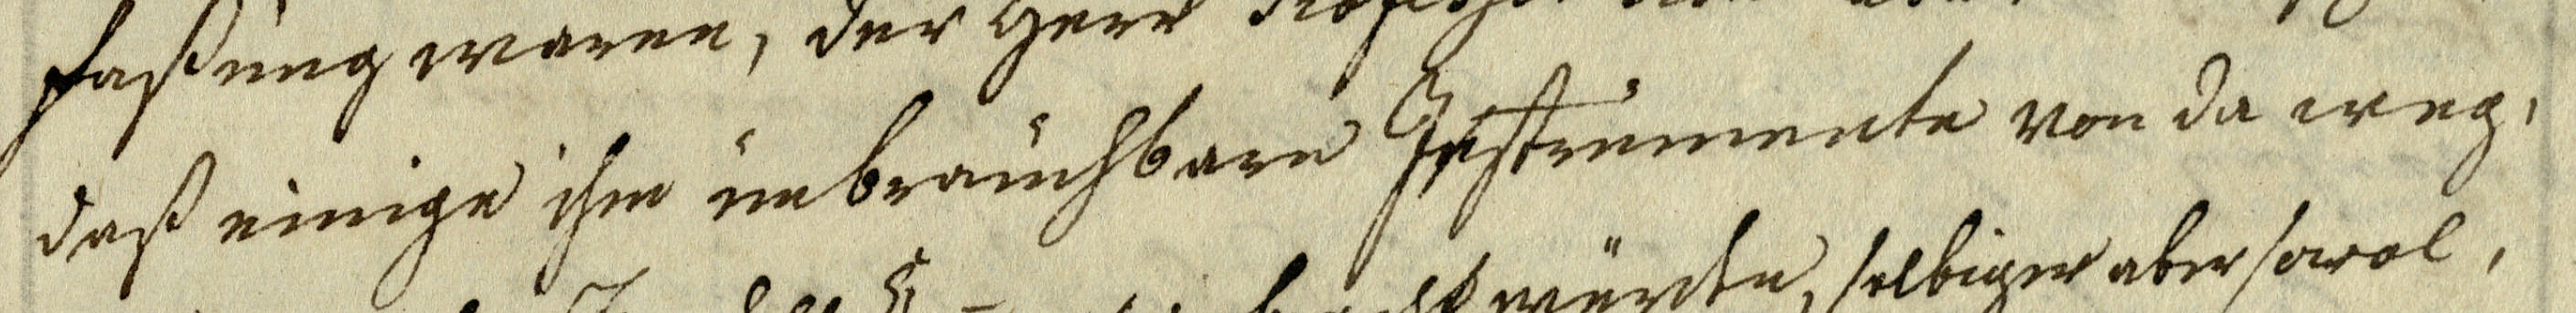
daß einige ihm unbrauchbare Instrumente von da weg,
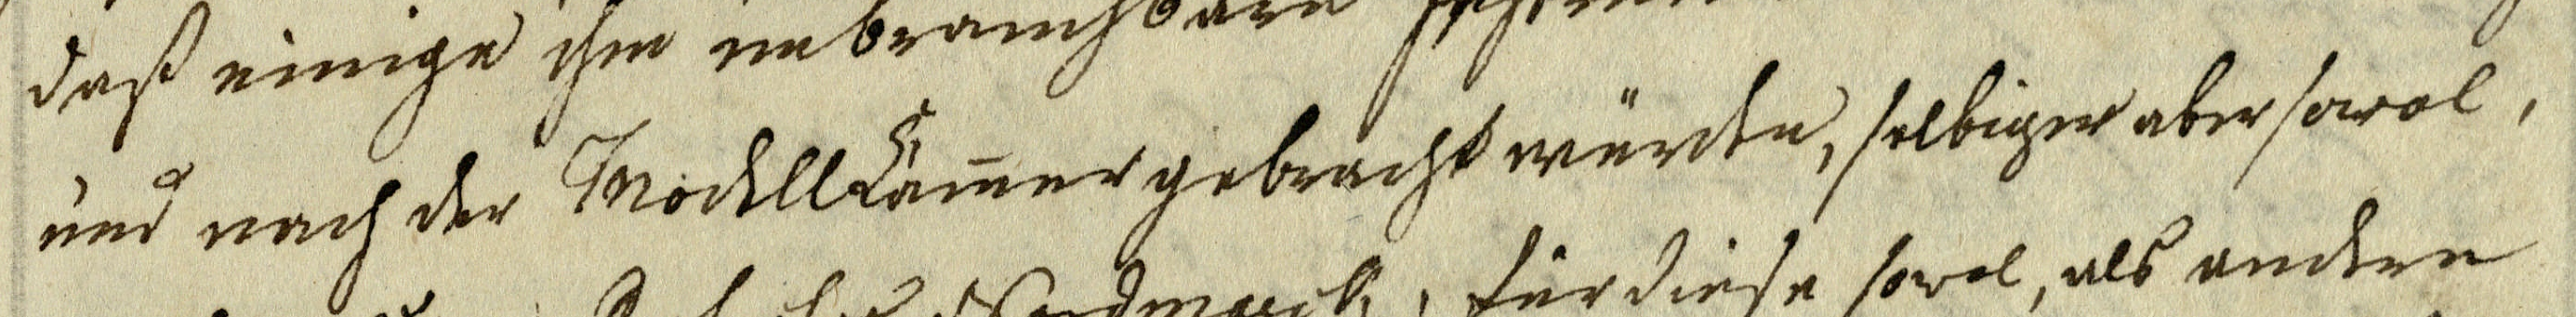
und nach der Modellkamer gebracht würden, selbiger aber sowol,
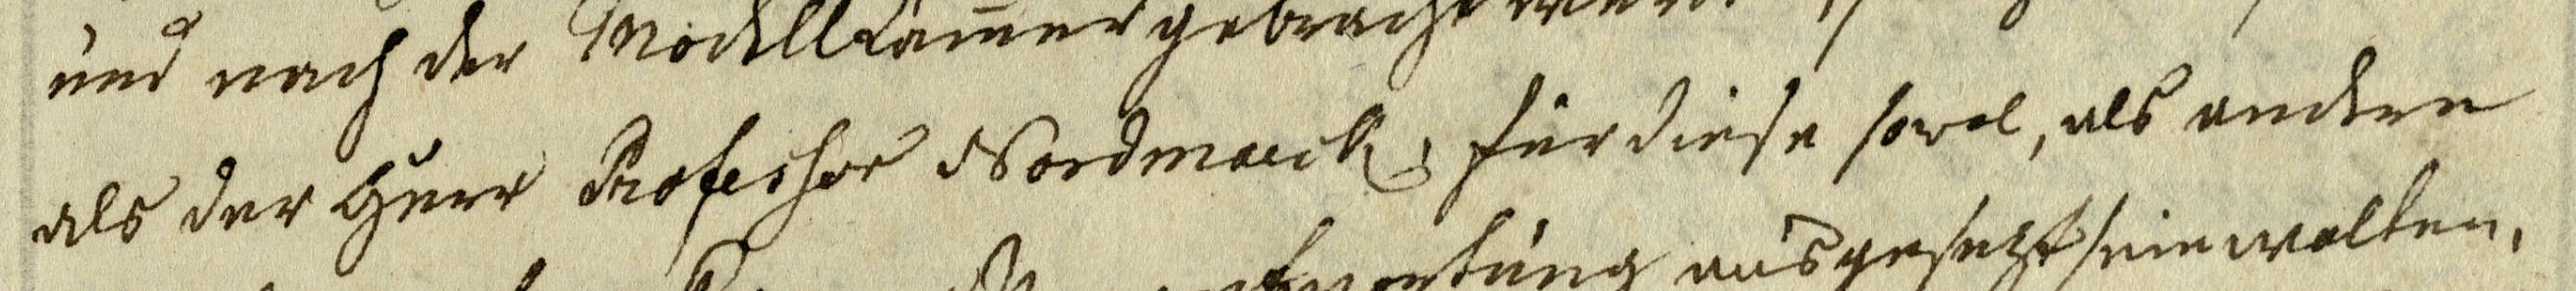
als der Herr Professor Nordmarck für diese sowol, als andern
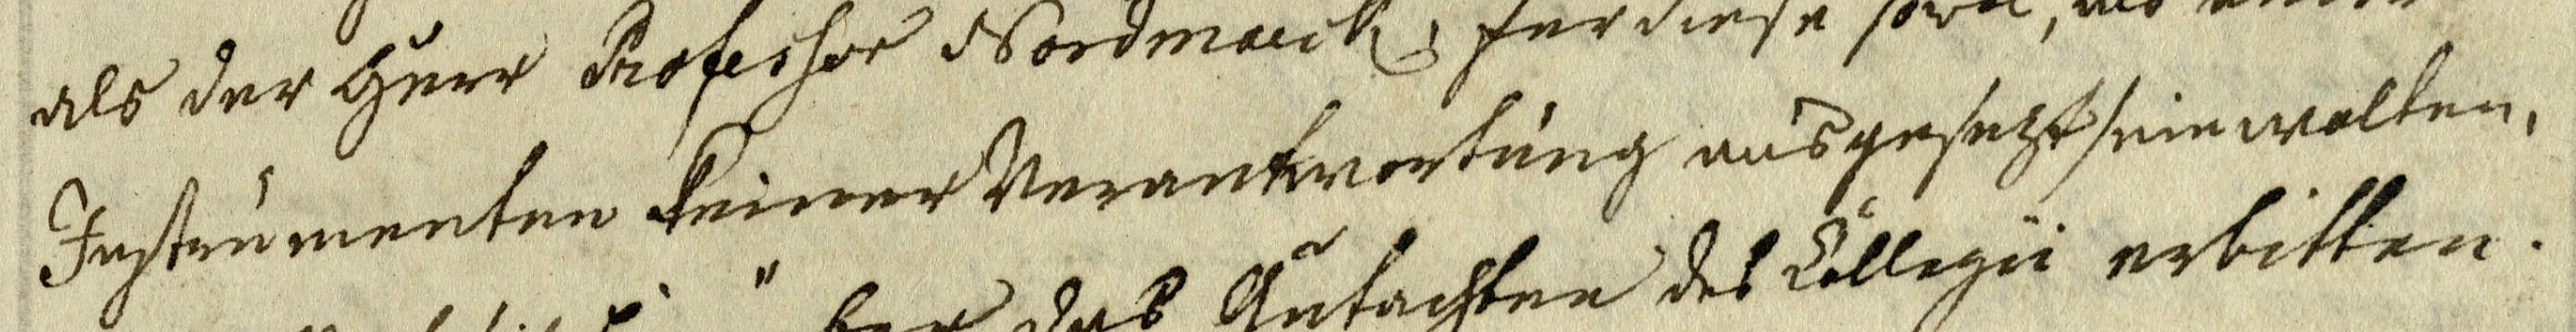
Instrumenten keiner Verantwortung ausgesezt sein wollen,
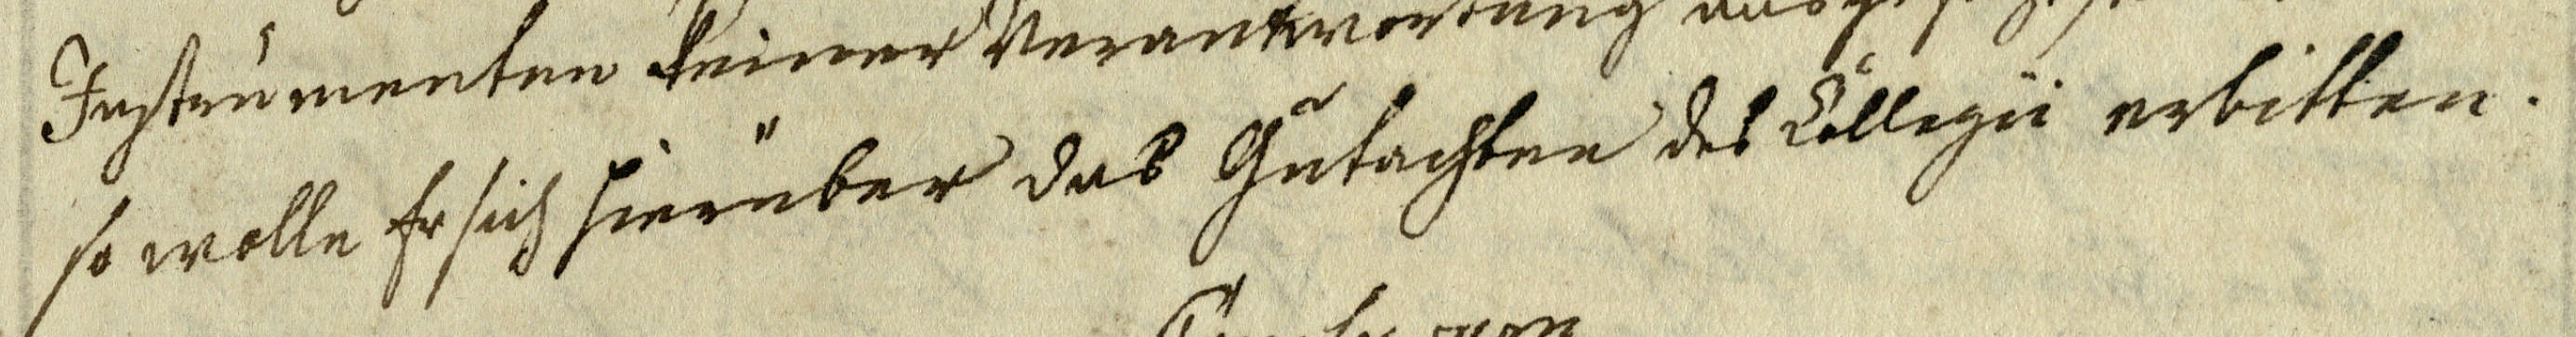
so wolle Er sich hierüber das Gutachten des Collegii erbitten.
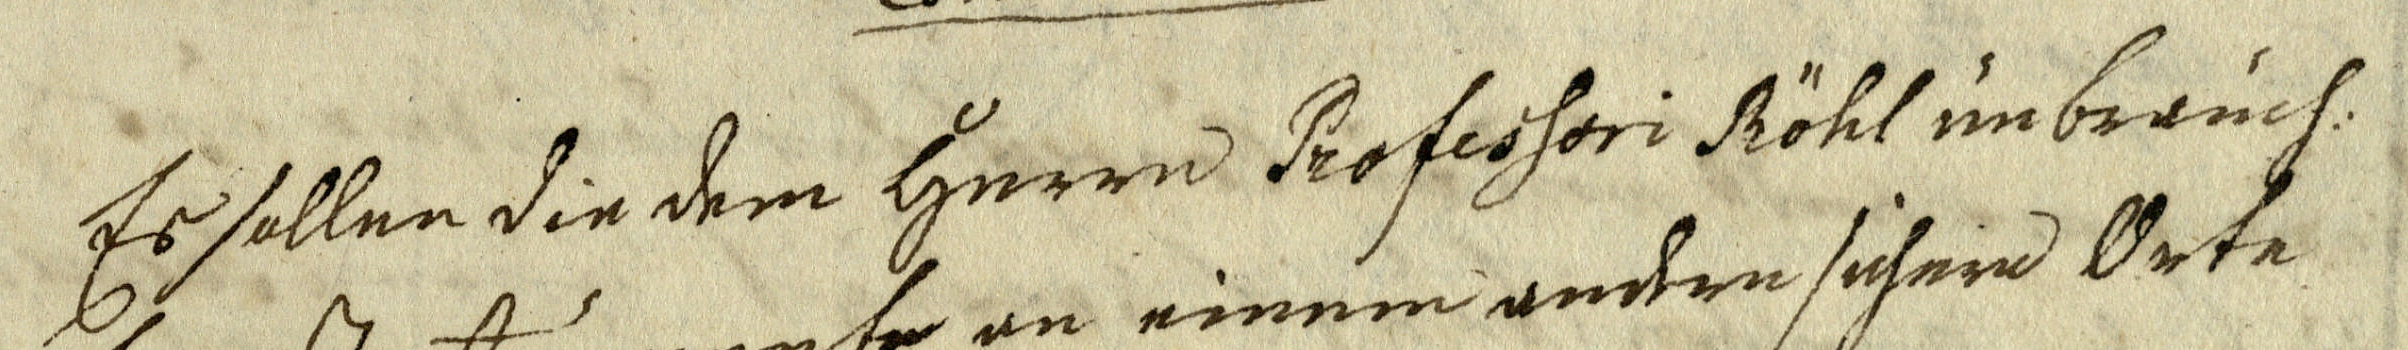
Es sollen die dem Herrn Professori Röhl unbrauch¬
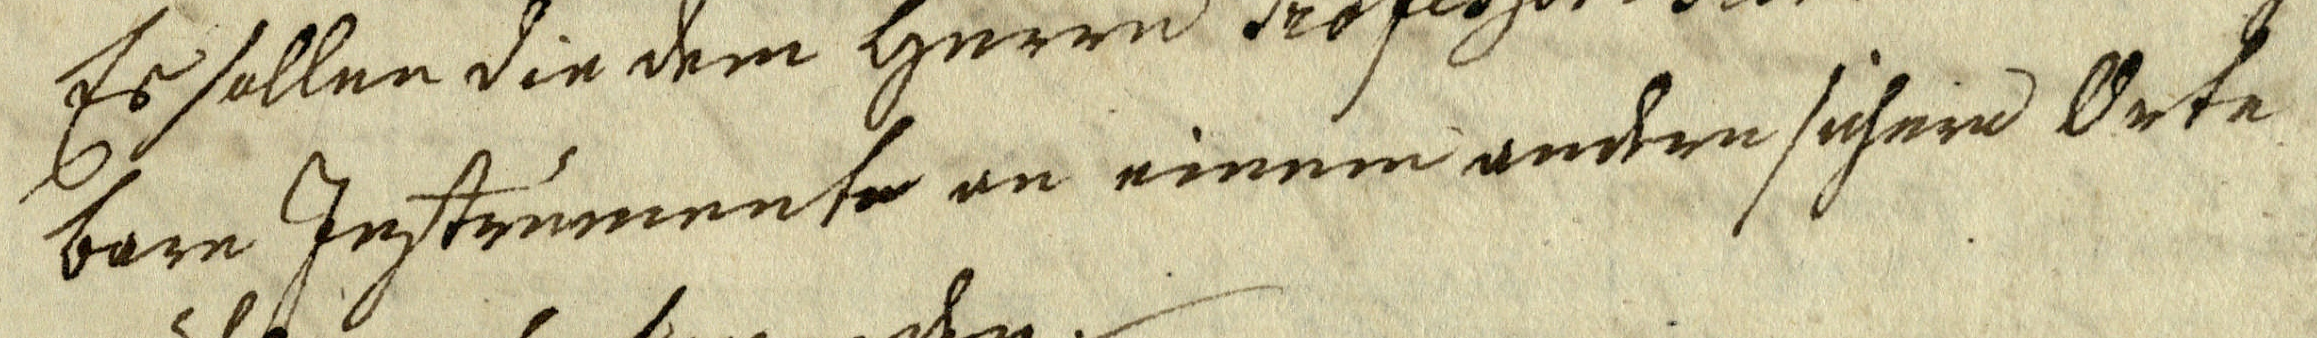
bare Instrumente an einem andern sichern Orte
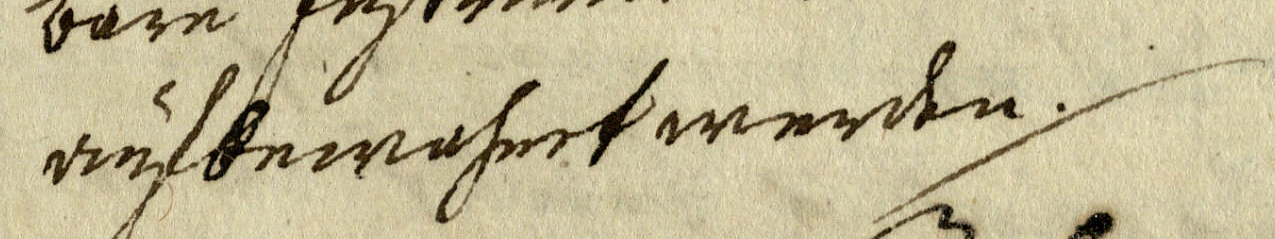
aufbewahret werden.
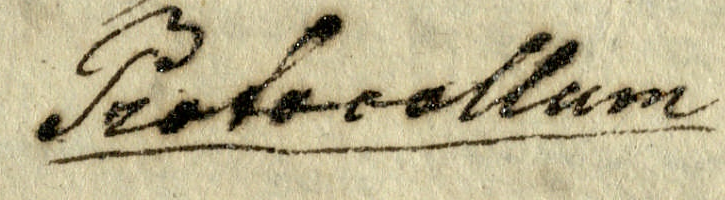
Protocollum
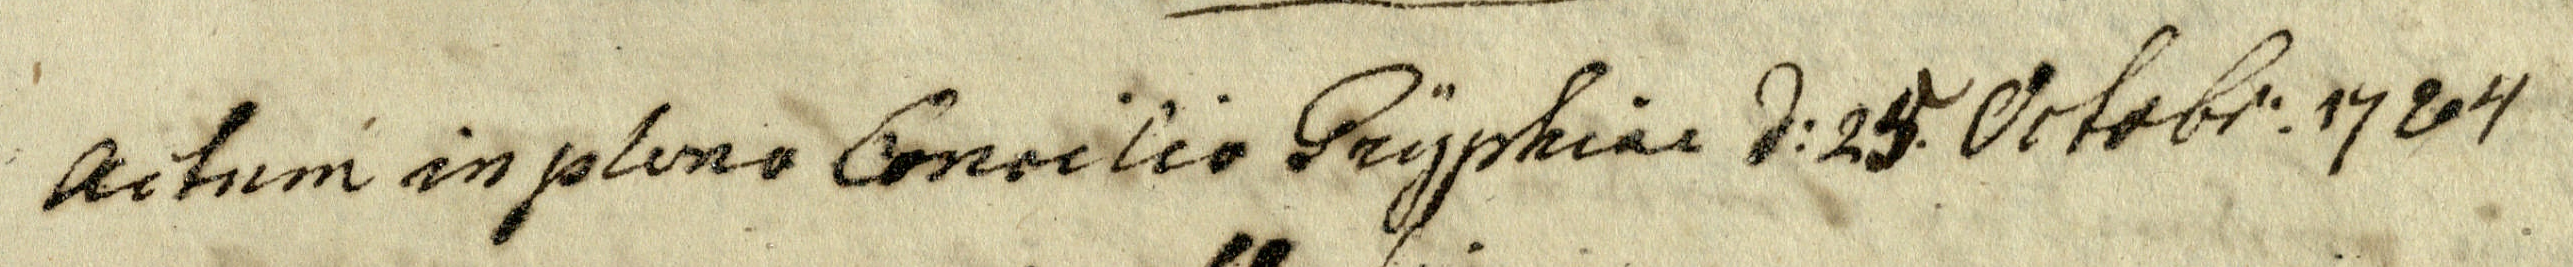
Actum in pleno Concilio Grÿphiae d. 25. Octobr. 1784
